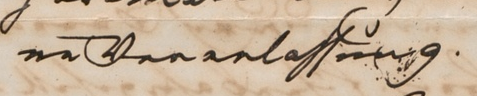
ne Veranlassung.
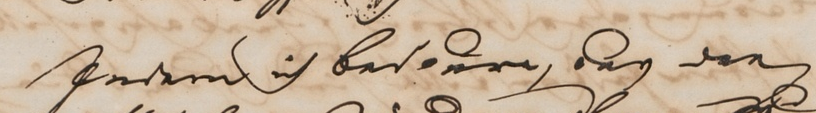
Indem ich bedauere, aus den
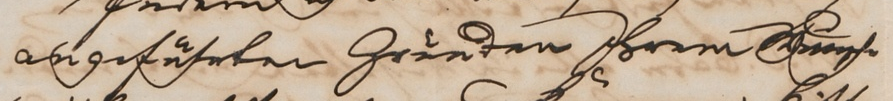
angeführten Gründen Ihrem Wunsche
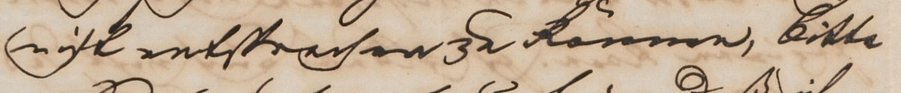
nicht entsprechen zu können, bitte
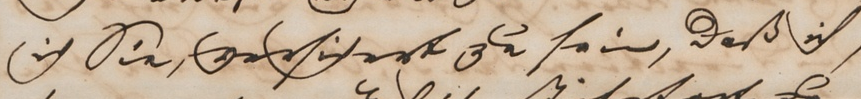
ich Sie, versichert zu sein, daß ich,
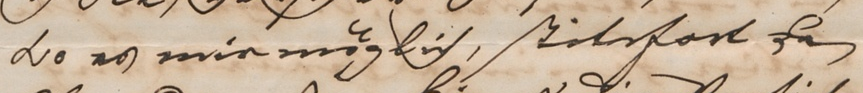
wo es mir möglich, stetsfort zu
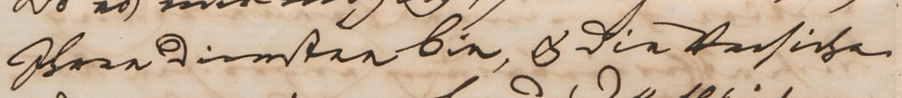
Ihren Diensten bin, & die Versiche-
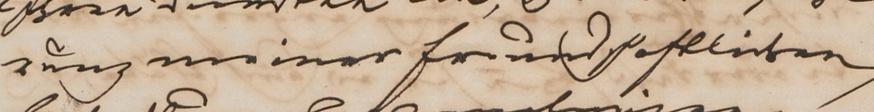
rung meiner freundschaftlichen
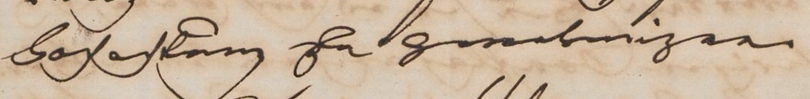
Hochachtung zu genehmigen
